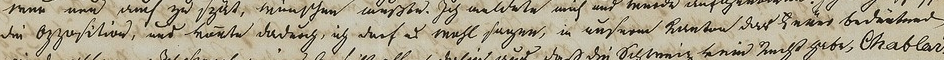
die Opposition, und konnte dadurch, ich darf es wohl sagen, in unserm Kanton das Feuer bedeutend
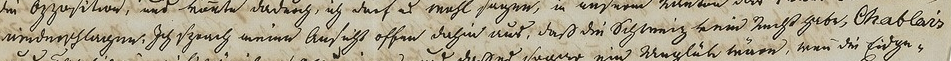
niederschlagen. Ich sprach meine Ansicht offen dahin aus, daß die Schweiz kein Recht habe, Chablais
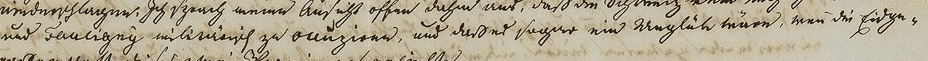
und Faucigny militärisch zu occupiren, und daß es sogar ein Unglük wäre, wenn die Eidge-
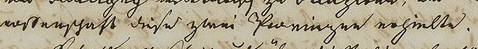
noßenschaft diese zwei Provinzen erhielte.
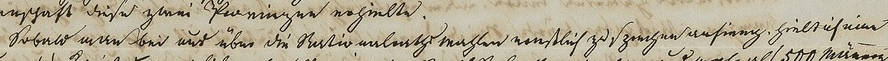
Sobald man bei uns über die Nationalrathswahlen ernstlich zu sprechen anfieng, hielt ich eine
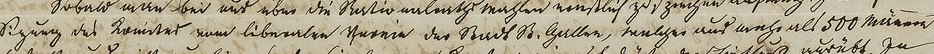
Sitzung des Komites vom liberalen Verein der Stadt St. Gallen, welches aus mehr als 500 Männern
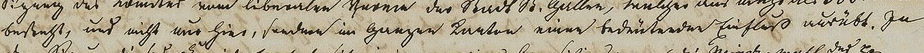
besteht, und nicht nur hier, sondern im Ganzen Kanton einen bedeutenden Einfluß ausübt. In
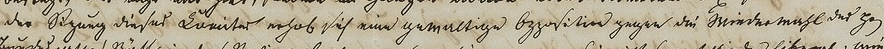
der Sitzung dieses Komites erhob sich eine gewaltige Opposition gegen die Wiederwahl des Hr.
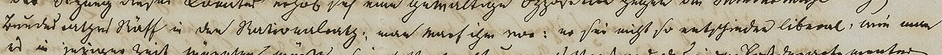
Bundesrathes Näff in den Nationalrath; man warf ihm vor, er sei nicht so entschieden liberal, wie man
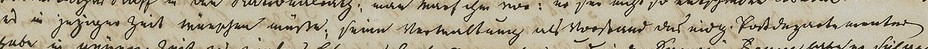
es in jeziger Zeit wünschen müßte; seine Verwaltung als Vorstand des eidg. Postgepartementes
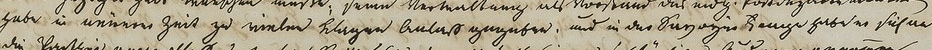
habe in neuerer Zeit zu vielen Klagen Anlaß gegeben, und in der Savoyer Frage habe er sich an
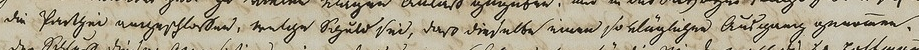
die Parthei angeschloßen, welche Schuld sei, daß dieselbe einen so kläglichen Ausgang genommen.
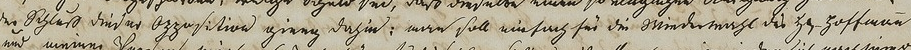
Der Schluß dieser Opposition gieng dahin: man soll einfach für die Wiederwahl des Hr. Hoffmann
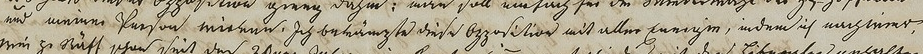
und meiner Person wirken. Ich bekämpfte diese Opposition mit aller Energie, indem ich nachwies,
